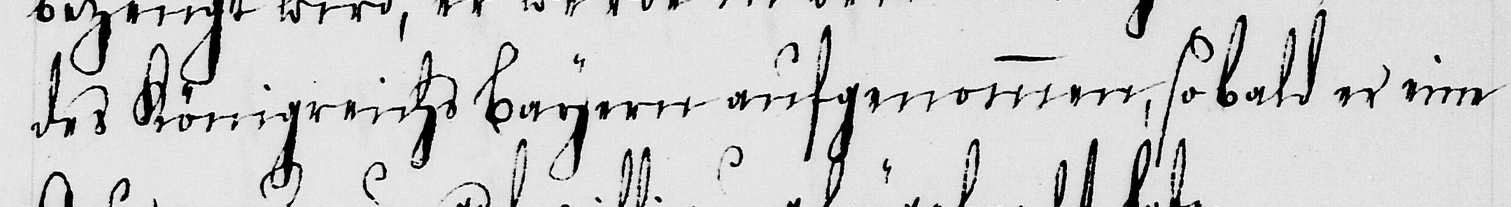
des Königreiches Bayern aufgenommen, so bald er eine
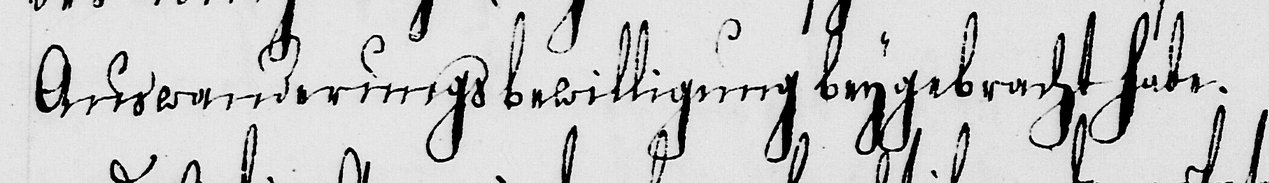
Auswanderungsbewilligung beygebracht habe.
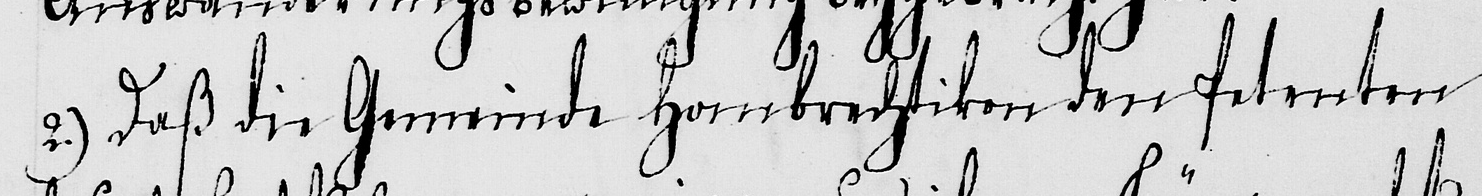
2.) Daß die Gemeinde Hombrechtikon den Petenten
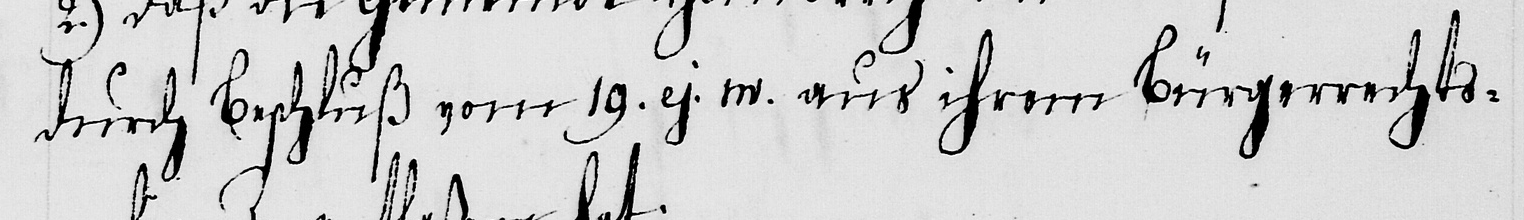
durch Beschluß vom 19. ej. m. aus ihrem Bürgerrechts¬
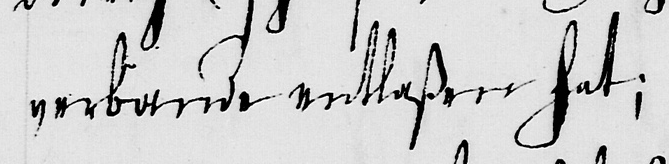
verbande entlaßen hat;
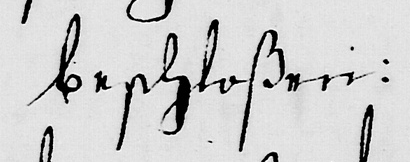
beschloßen:
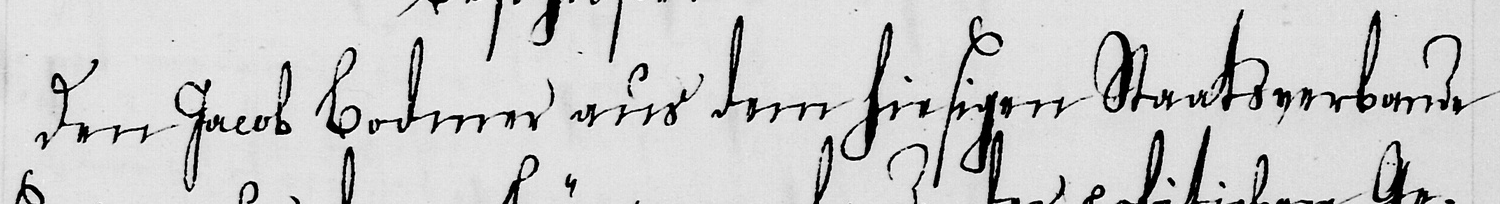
Den Jacob Bodmer aus dem hiesigen Staatsverbande
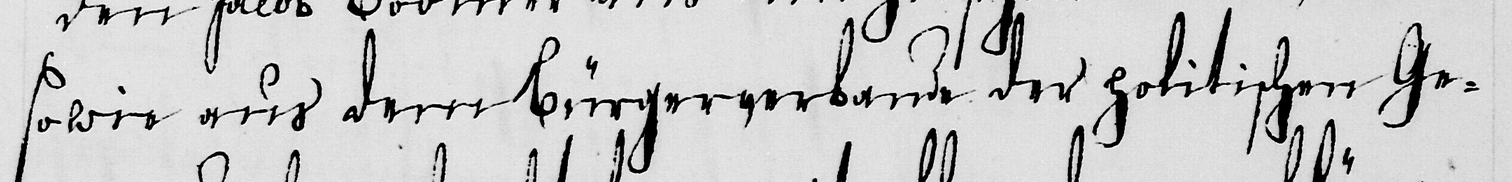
sowie aus dem Bürgerverbande der politischen Ge¬
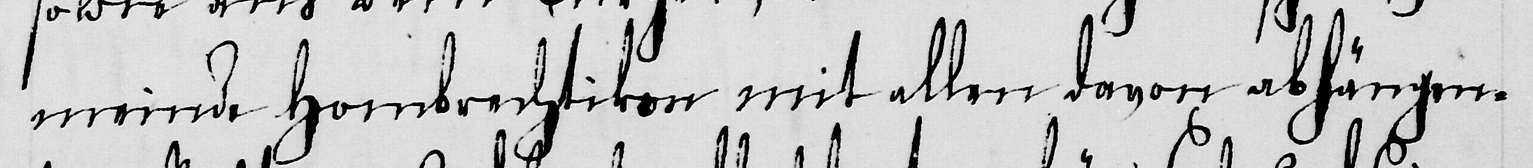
meinde Hombrechtikon mit allen davon abhängen¬
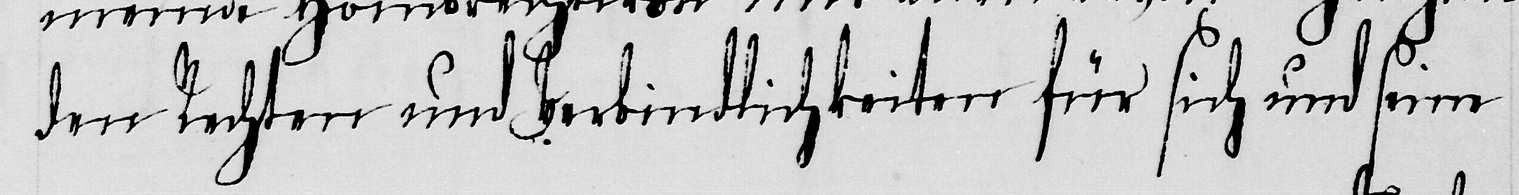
den Rechten und Verbindlichkeiten für sich und seine
